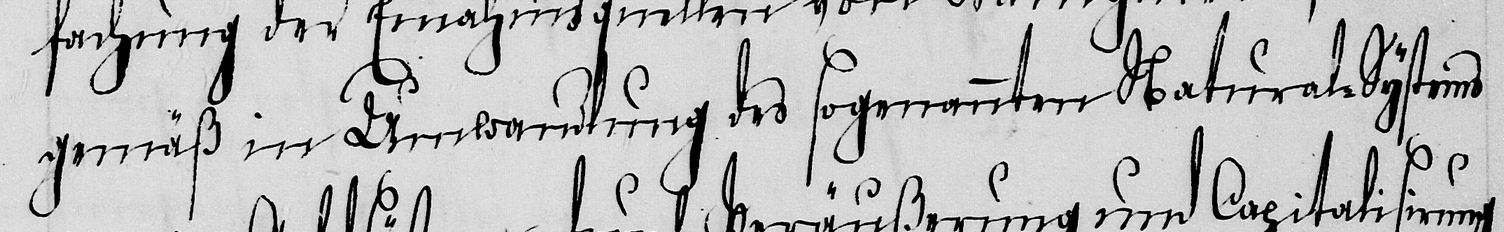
gemäß in Umwandlung des sogenannten Natural-Systems
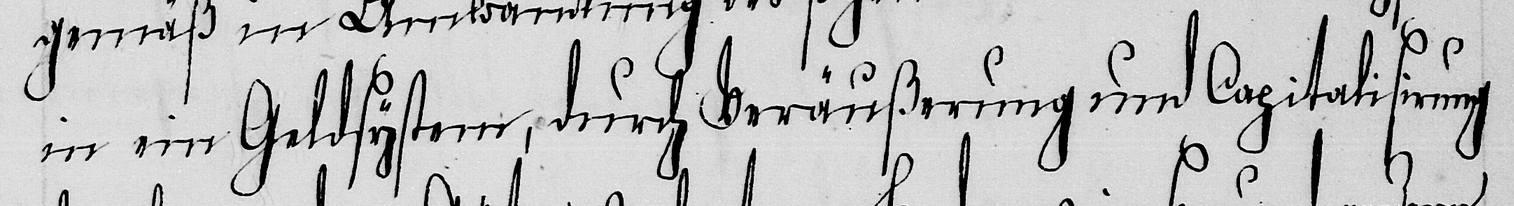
in ein Geldsystem, durch Veräußerung und Capitalisirung
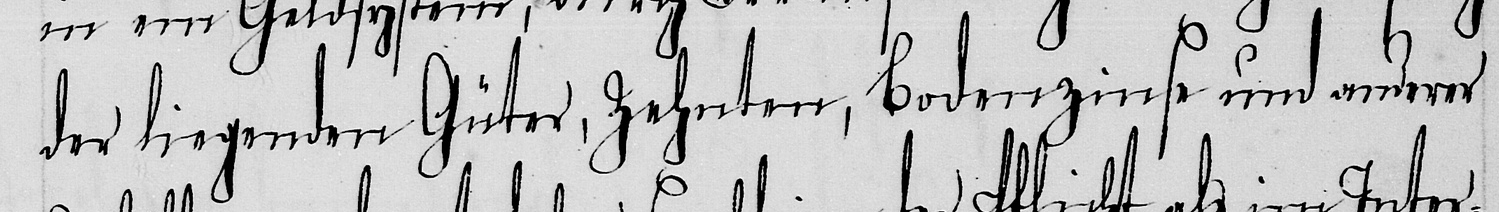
der liegenden Güter, Zehnten, Bodenzinse und anderer
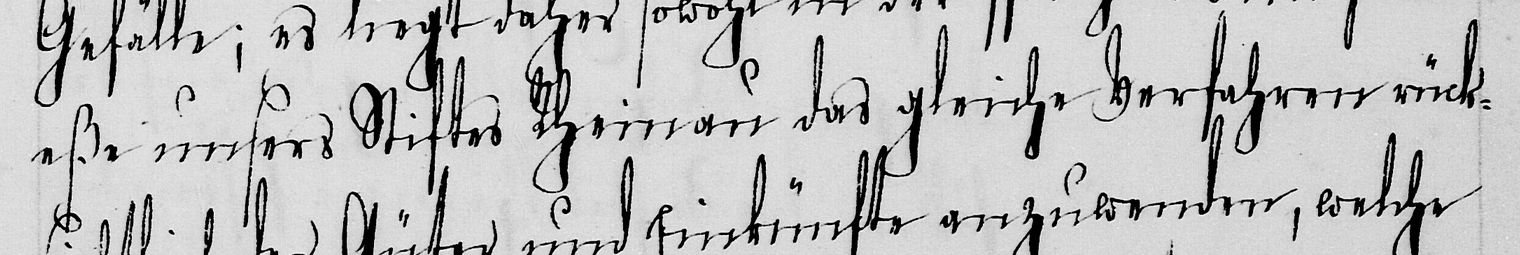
eße unsers Stiftes Rheinau das gleiche Verfahren rücks¬
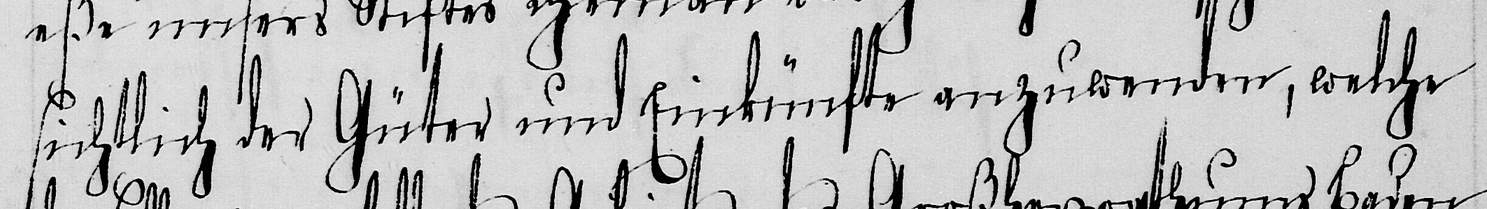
ichtlich der Güter und Einkünfte anzuwenden, welche
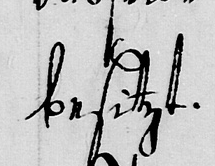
besitzt.
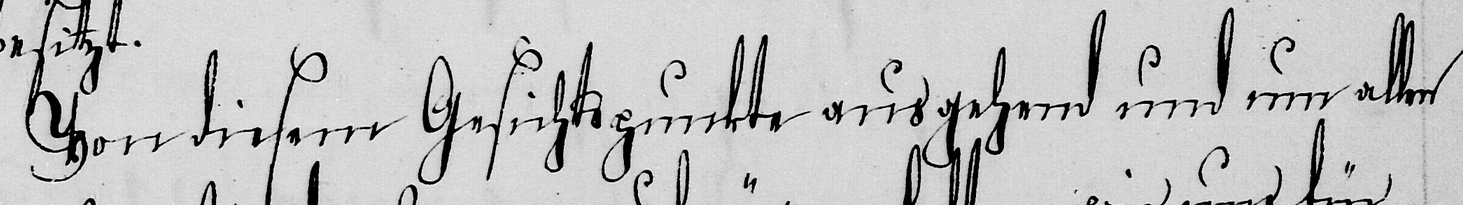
Von diesem Gesichtspunkte ausgehend und um al¬
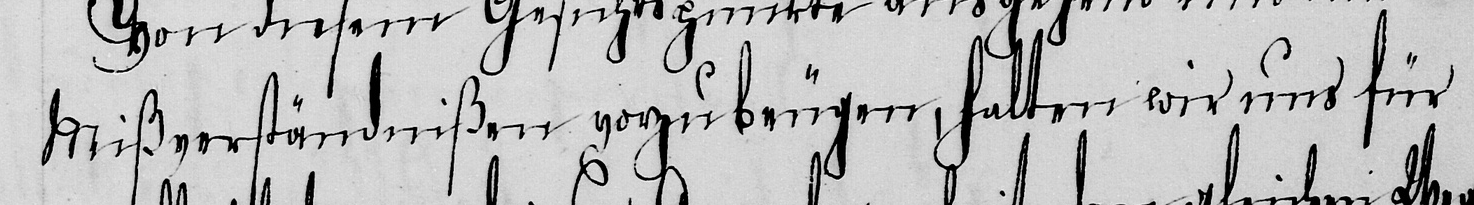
Mißverständnißen vorzubeugen, halten wir uns für
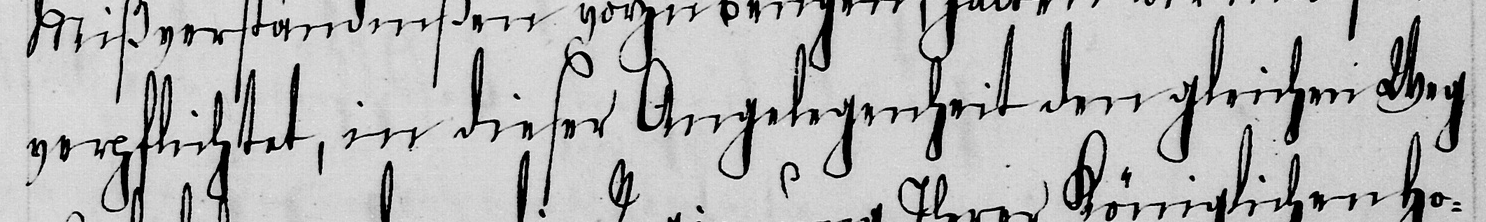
verpflichtet, in dieser Angelegenheit den gleichen Weg
